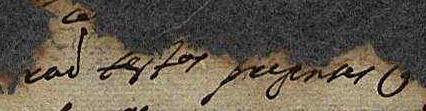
raõ testas presentes q̄
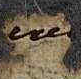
cre
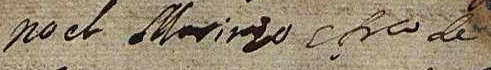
noel Marinho e frco de
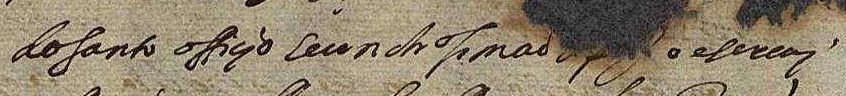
do santo officjo E eu notro simaõ _ o escreuj
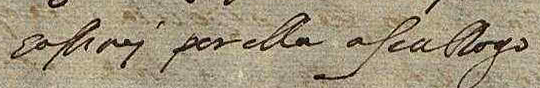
E assinej por ella a seu Rogo
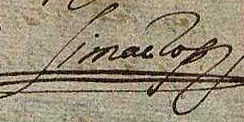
Simaõ lopez
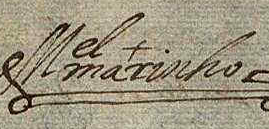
Mel marinho
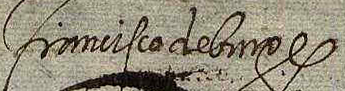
francisco de burges
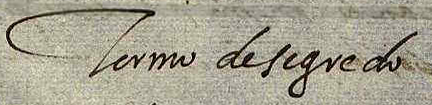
Termo de segredo
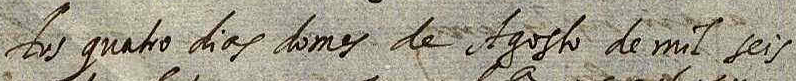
Aos quatro dias do mes de Agosto de mil seis
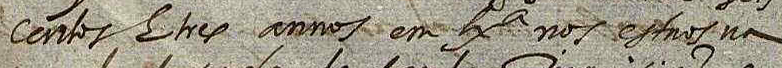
centos E tres annos em lxa nos estaos na
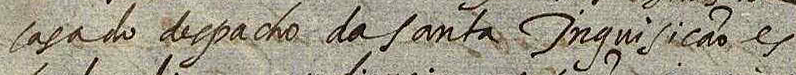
casa do despacho da santa Jnquisiçaõ es
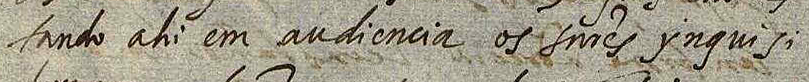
tando ahi em audiencia os snrēs ynquisi
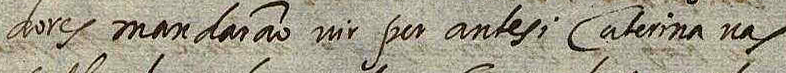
dores mandarão uir perante si Caterina uas
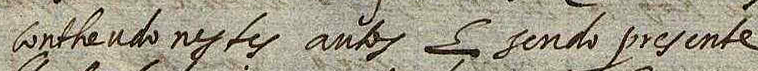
contheudo nestes autos E sendo presente
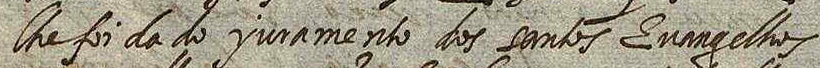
lhe foi dado yuramento dos santos Euangelhos
